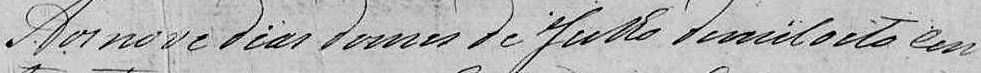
Aos nove dias do mes de Julho de mil oitocen
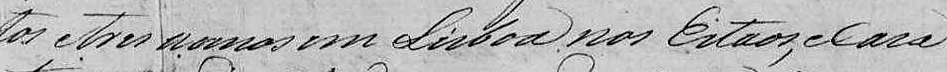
tos e tres annos em Lisboa nos Estaos, e Casa
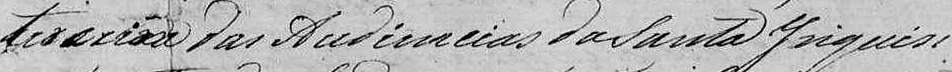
terceira das Audiencias da Santa Inquisi
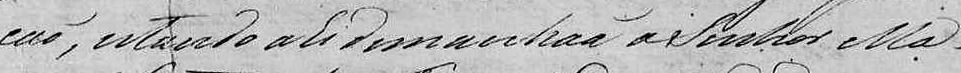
cão, estando ahi de manhaã o Senhor Ma
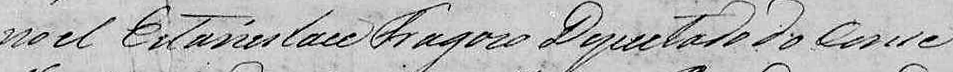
noel Estanislau Fragoso Deputado do Conse
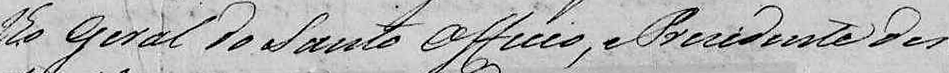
lho Geral do Santo Officio, e Presidente des
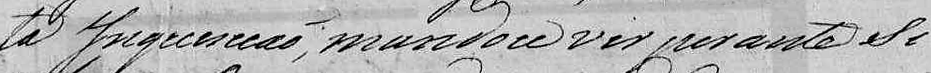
ta Inquesecaõ, mandou vir perante si
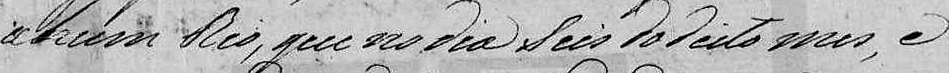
a hum Reo, que no dia seis do dicto mes, e
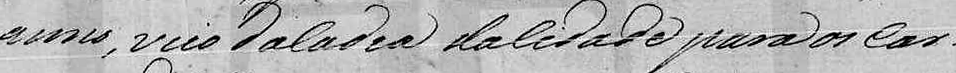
anno, veio da Cadea da Cidade para os car
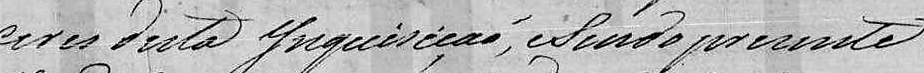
ceres desta Inquisiçaõ, e sendo presente
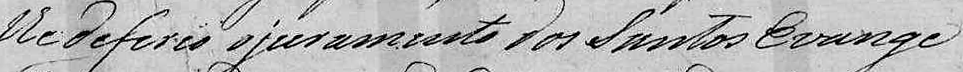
lhe defereo o juramento dos Santos Evange
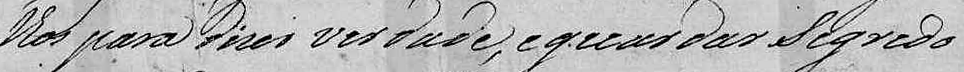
lhos para dizer verdade, e guardar segredo
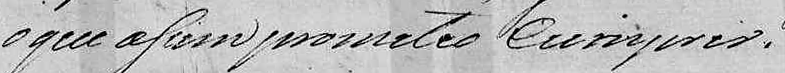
o que assim prometeo Cumprir.
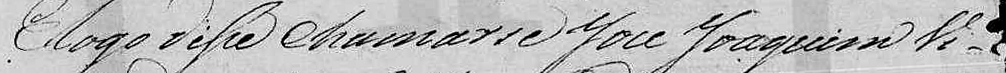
E logo disse chamarse Jose Joaquim Vi
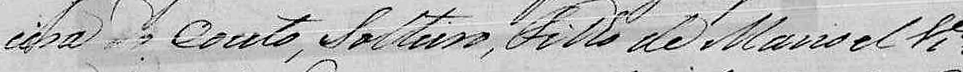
eira do Couto, solteiro, filho de Manoel Vi
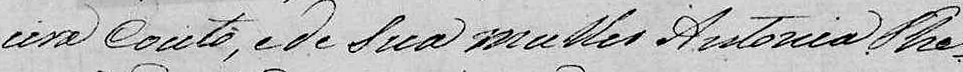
eira Couto, e de sua mulher Antonia The
